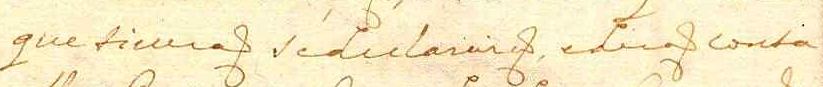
que tiueraõ se declararaõ, e deraõ conta
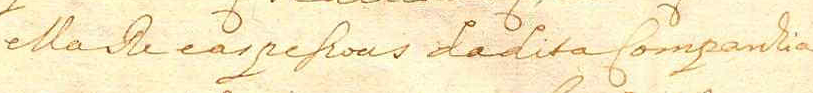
ella Re e as pessoas da dita Companhia
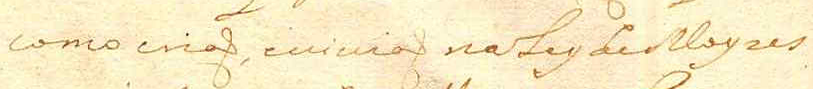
como criaõ, e uiuiaõ na Ley de Moyzes
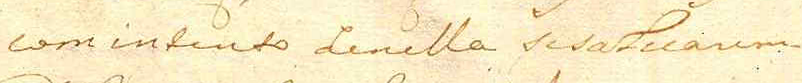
com intento de nella se saluarem
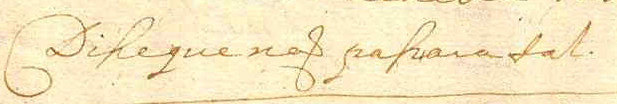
Disse que naõ passara tal.
